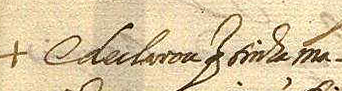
+ e declarou q̄ tinha ma
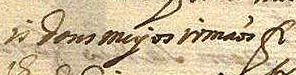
is dous meyos irmaõs fi
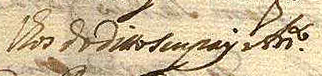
lhos do ditto seu pay Anto.
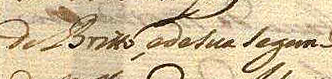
de Britto, e de sua segun
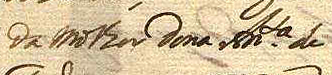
da molher Dona Ant.a de
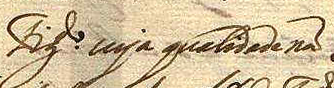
Figd.o cuja qualidade naõ
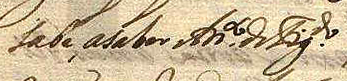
sabe, a saber Anto. de Figd.o
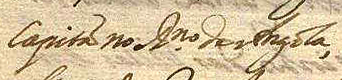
capitaõ no Rn.o de Angola,
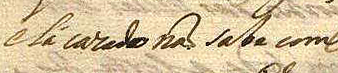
e lá cazado naõ sabe com
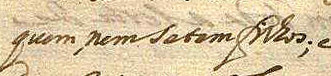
quem, nem se tem filhos; e
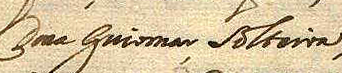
Dona Guiomar, solteira,
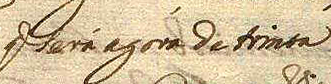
q̄ será agora de trinta
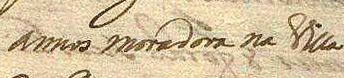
annos moradora na Villa
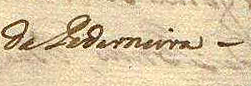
da Padarneira -
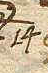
14
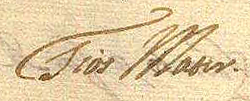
Tios Mater.
